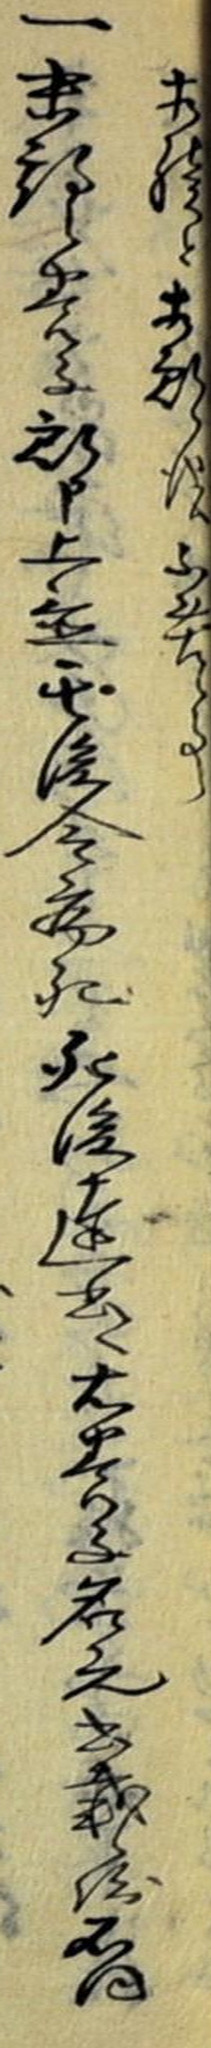一末期養子願申上置其後令病死死後達書へ右養子名元書載候儀不同
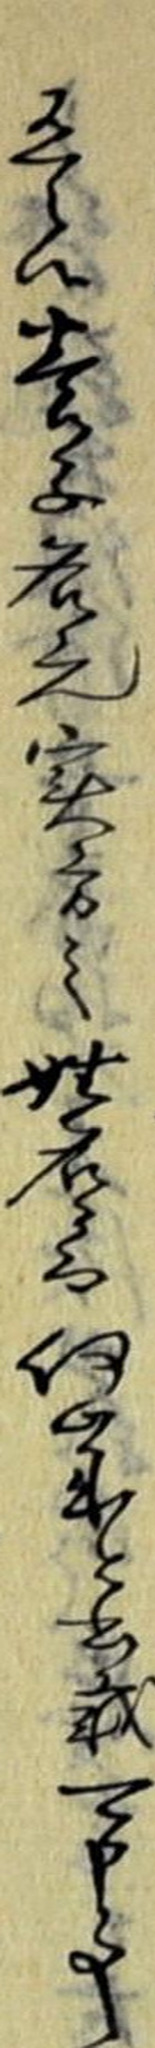有之候養子名元実方之姓名に而何歳と書載可申事
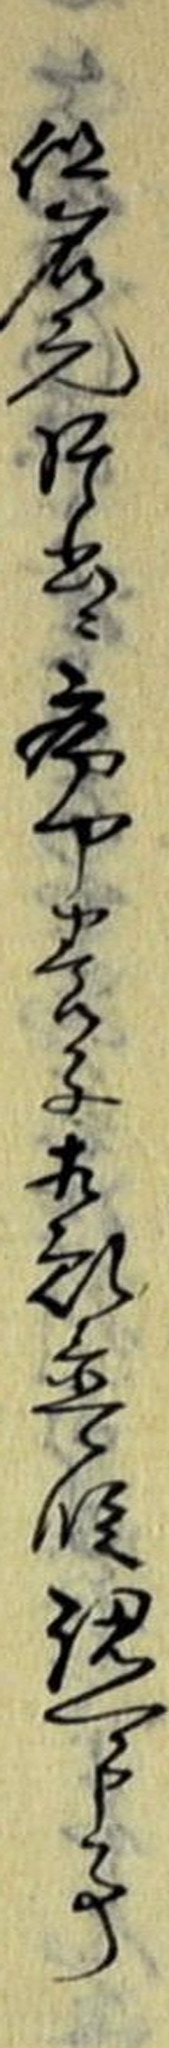但名元片書に病中養子相願置候段認可申事
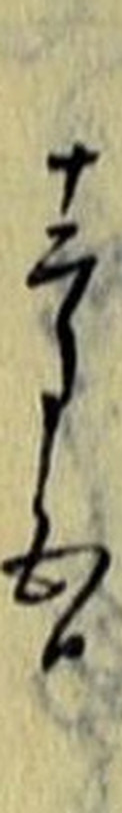十二月五日
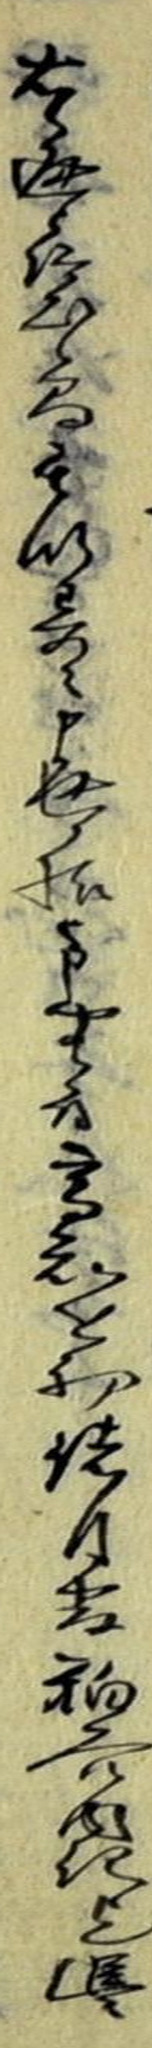右之通被仰出候間其段寄々申通候様被申聞候に付高知を初諸月番粕谷内記迄追々
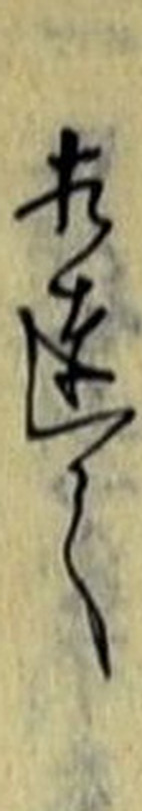相達之

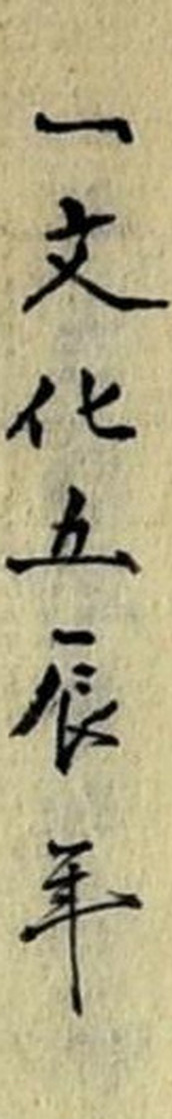一文化五辰年
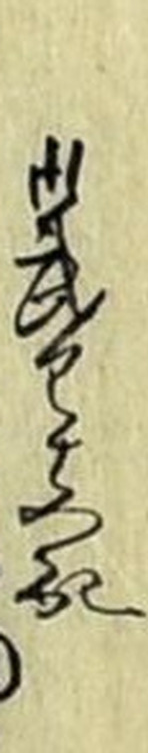御武具支配
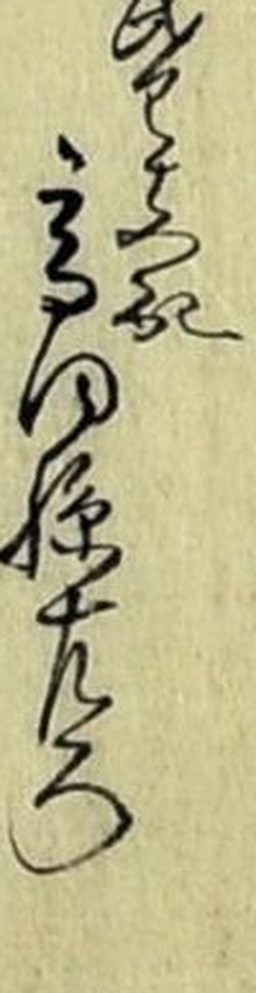髙田孫左衛門
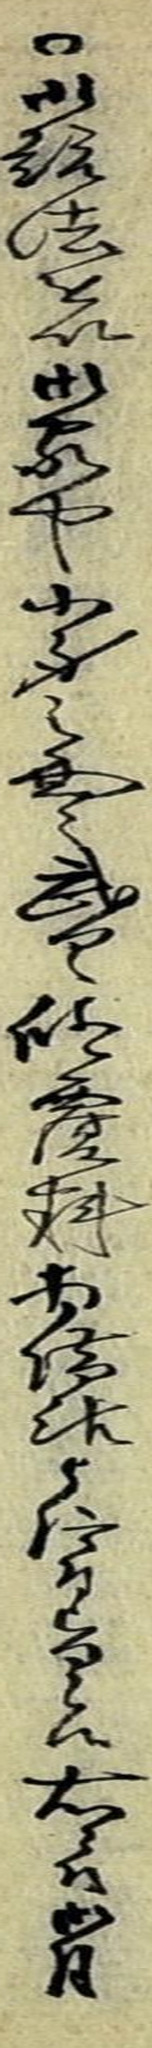○御趣法を以御家中小身之面々武具修覆料拝借銀被仰付旨に候右に付御自
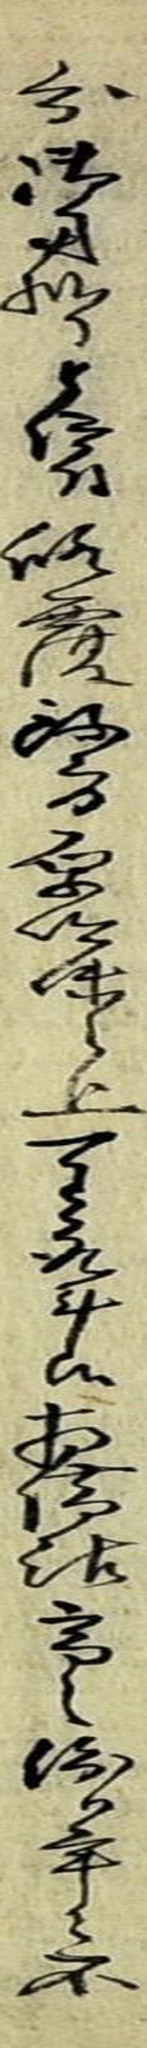分御用掛り被仰付修覆致方厚吟味之上可被取斗候拝借銀高之儀は年々不
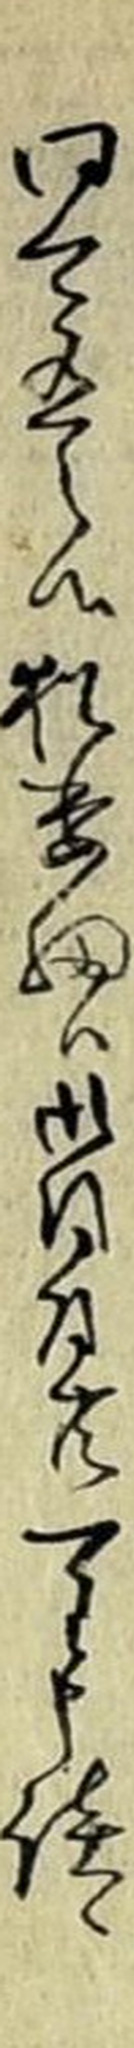同可有之候猶委細は御目付共可被申談候
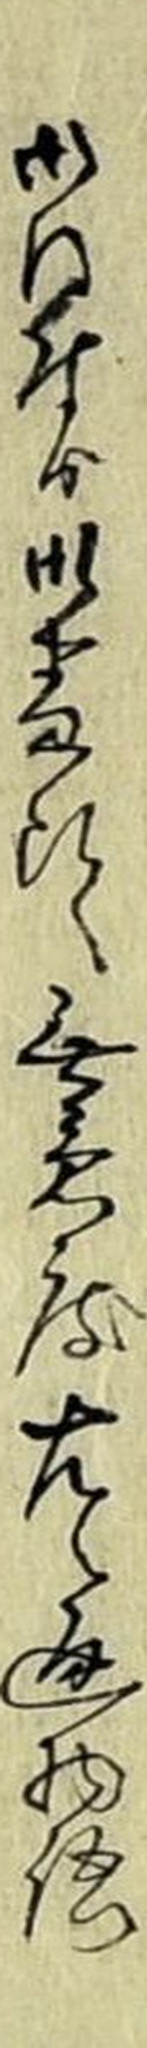御目付ゟ御番頭へ無急度左之通物語
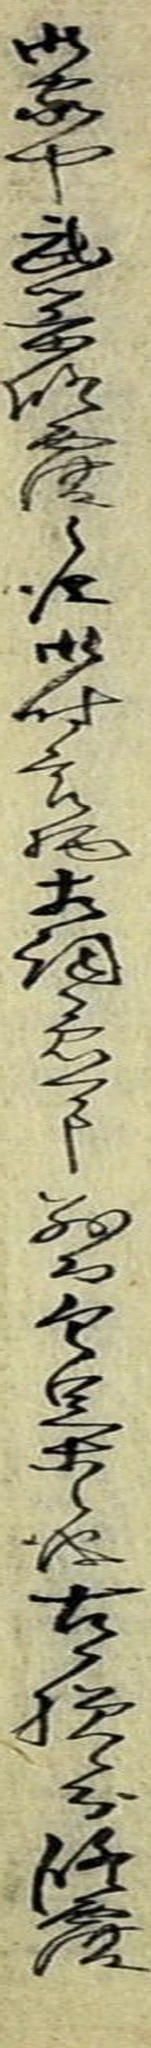○御家中武器修覆之儀御時節柄相調兼可申別而具足等之儀古く損候分修覆
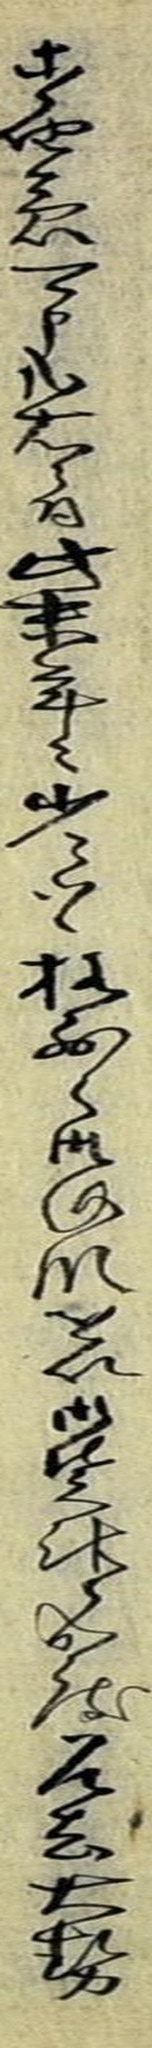等届兼可申哉右に付此末年々少々つヽ格別之御趣段を以御貸銀被成度乍去大勢
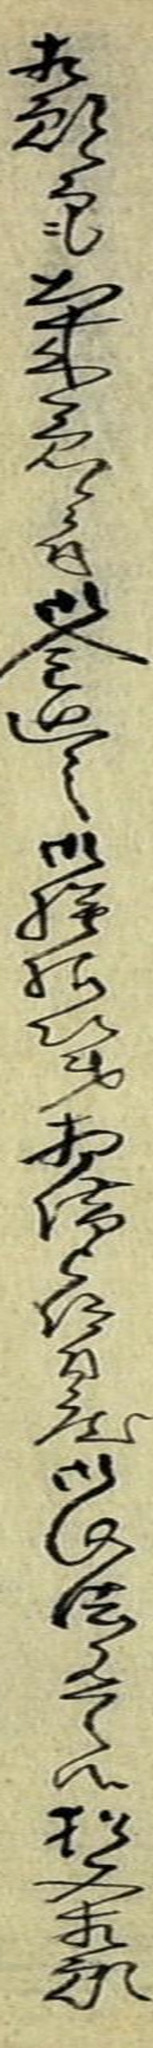相願候而も出来兼候に付御金廻之御模様次第拝借被仰付度御趣法有之候猶又相願
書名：命令之部 四
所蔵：福井県文書館 Fukui Prefectural Archives
